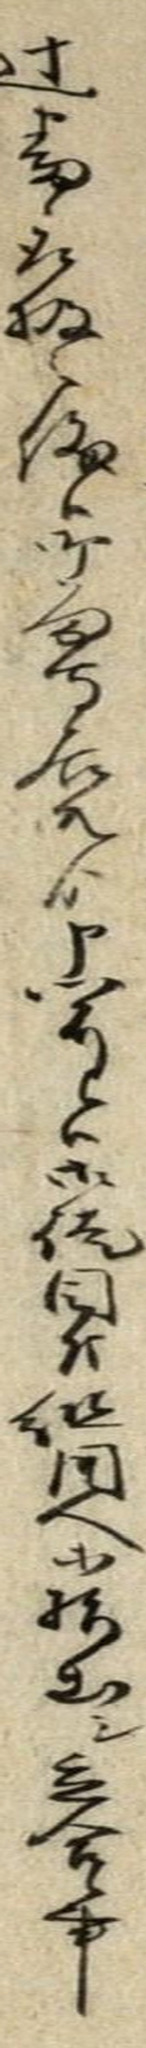一辻番取扱之儀ハ御留守居共ゟ申聞候ハ御徒目付組用人等指出シ立合候事
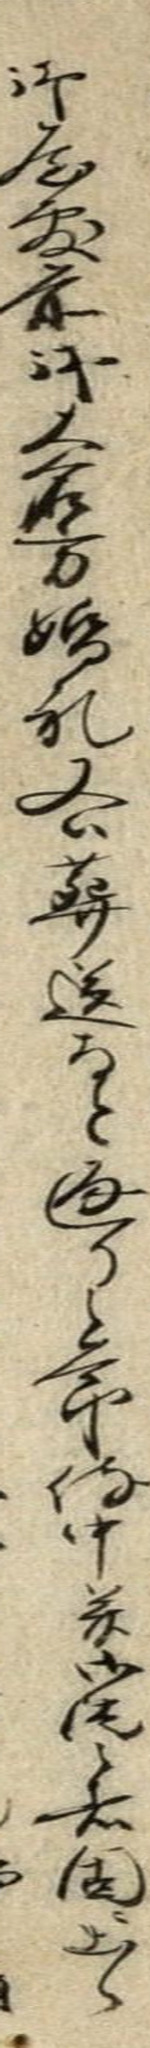一御屋敷前御大名方婚礼又ハ葬送なと通り候節侍中并御徒之者固ニ出候
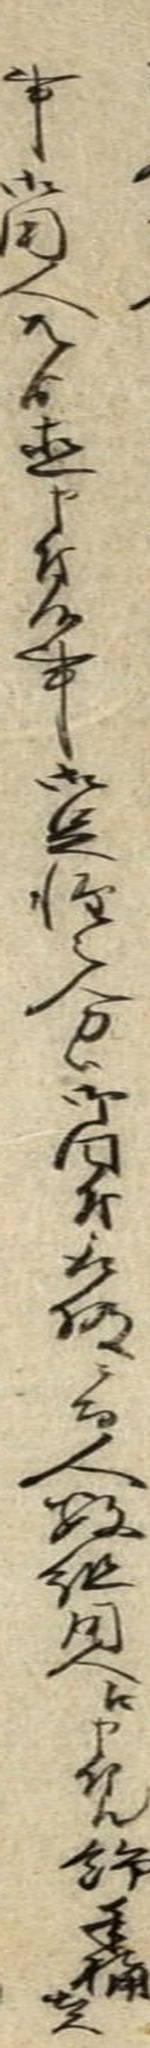事御用人共ゟ直申付候事御足軽之分ハ御目付取扱ニ而人数組用人江申付ル飾手桶出ス
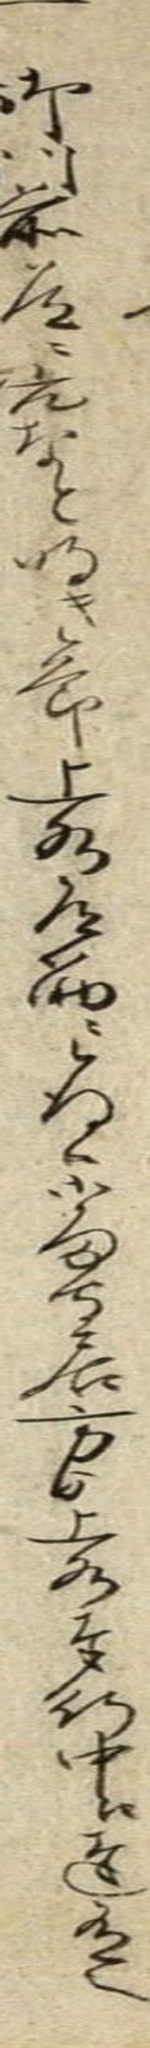一御門前道ニ坑なと明き候節上水道筋ニ候得ハ御留守居方ゟ上水奉行中江達有之
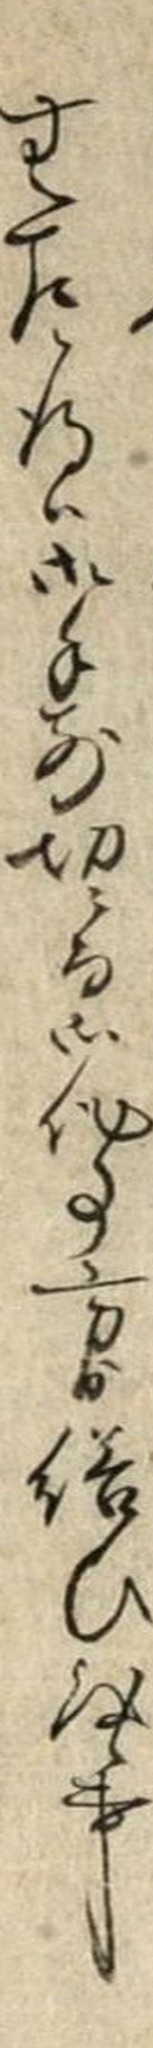無左候得ハ御手前切ニ而御作事方ゟ繕ひ致候事
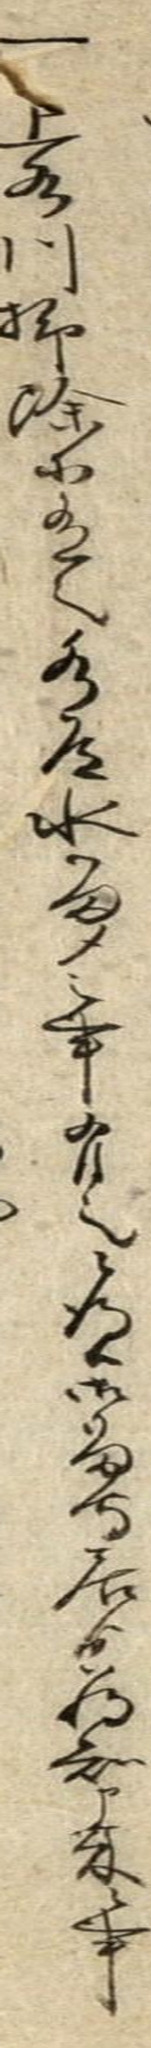一上水川掃除等有之水道水留メ之事有之候得は御留守居ゟ為知申来候事
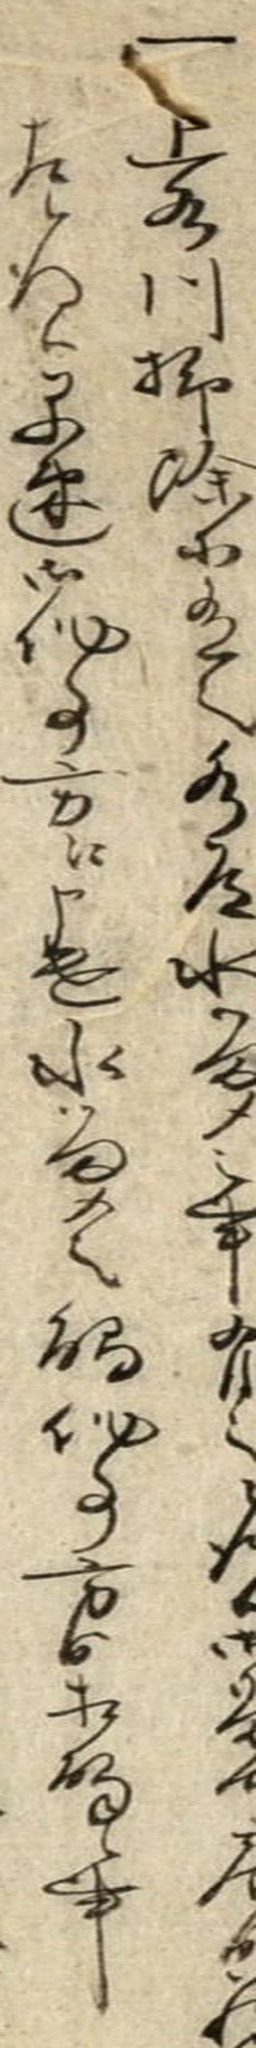左候得は早速御作事方江申遣水留メ之触作事方ゟ相触候事
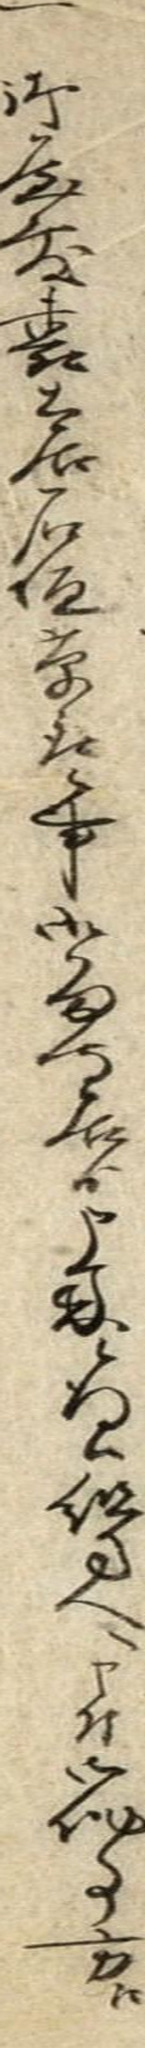一御屋敷裏土居石垣草取之事御留守居ゟ申来候得ハ組用人へ申付御作事方江
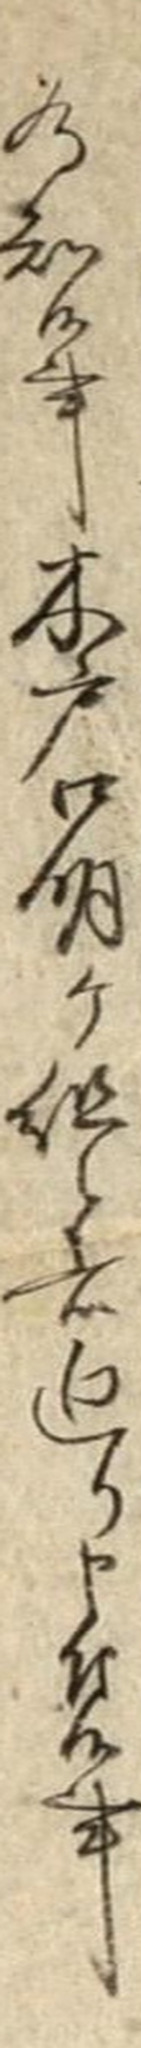為知候事木戸口明ケ組之者廻り申付候事
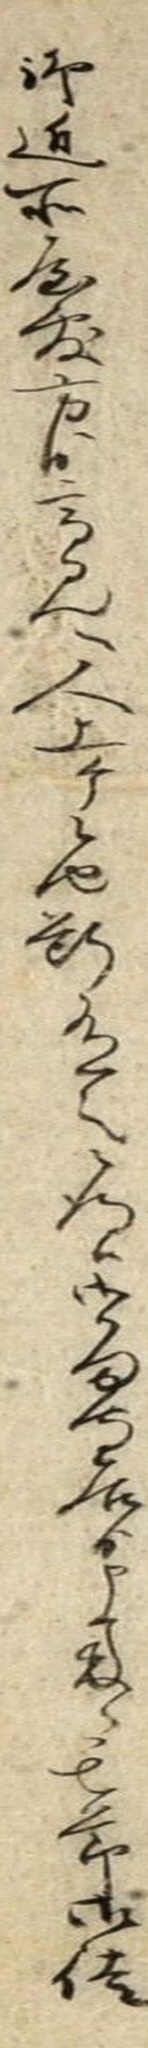一御近所屋敷方ゟ高見へ人上ケ候由断有之候得ハ御留守居ゟ申来候其節御徒
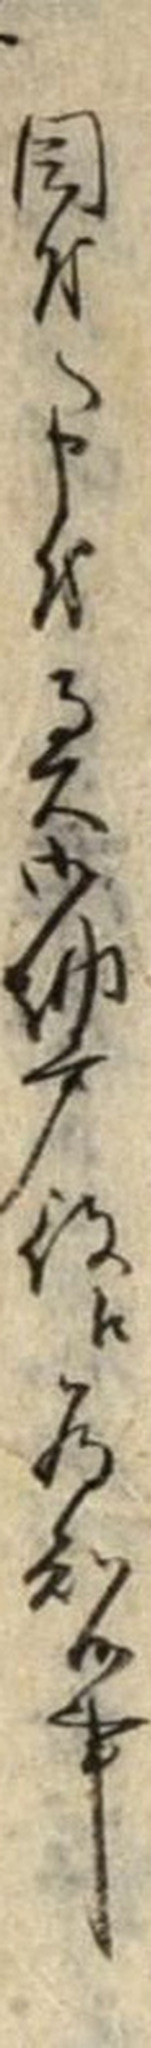目付へ申付奥御納戸役江為知候事
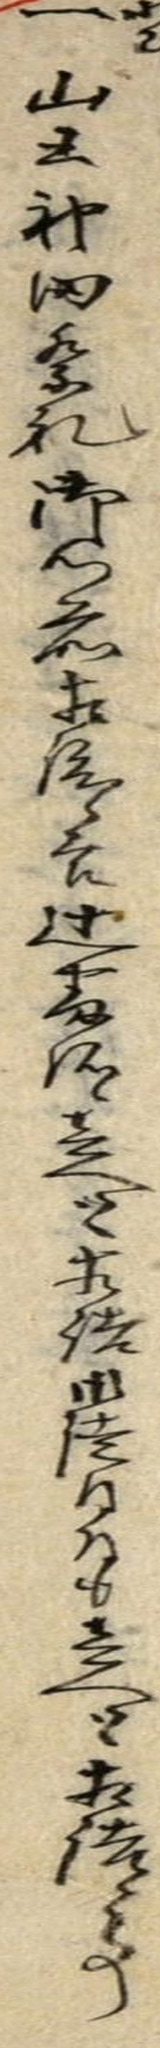一山王神田祭礼御門前相渡候節辻番所へ壱人ツヽ相詰御徒目付も壱人ツヽ相詰候事

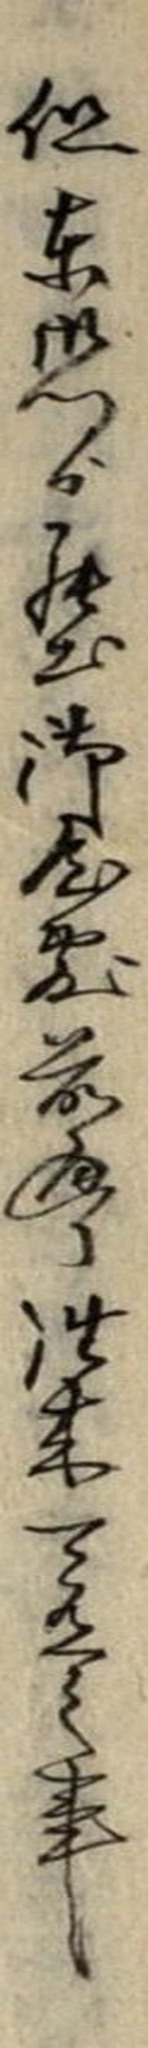但東御門ゟ罷出御屋敷前通り往来可有之事
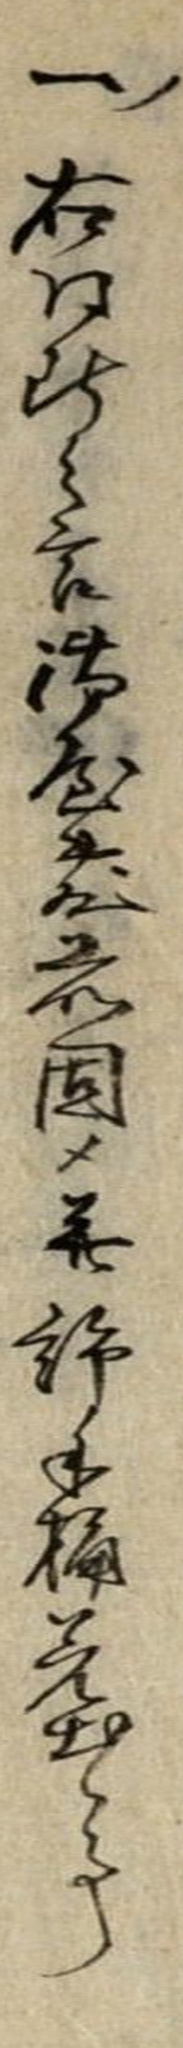一右同断之節御屋敷前固メ并飾手桶差出候事

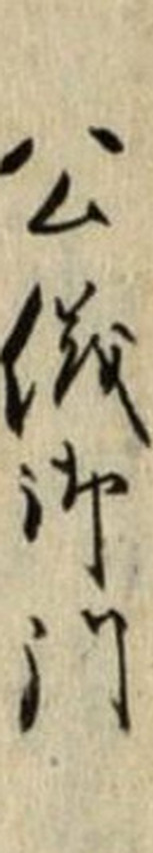公儀御門
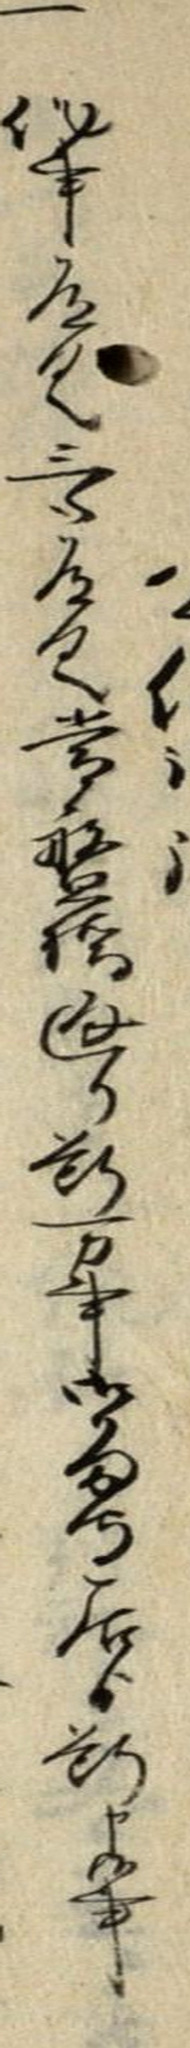一作事道具三ツ道具常盤橋通り断万事御留守居ゟ断申候事
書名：三都并道中之部
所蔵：福井県文書館 Fukui Prefectural Archives
